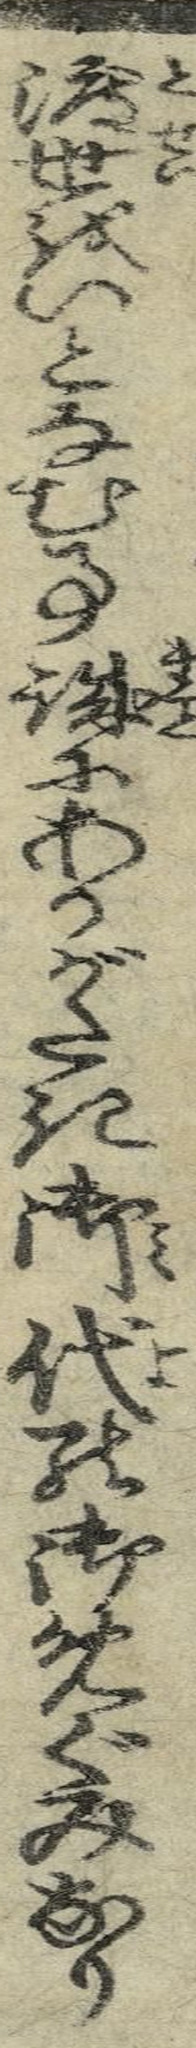渡世をいとなむ事誠にありがたき御代の御めぐみなり

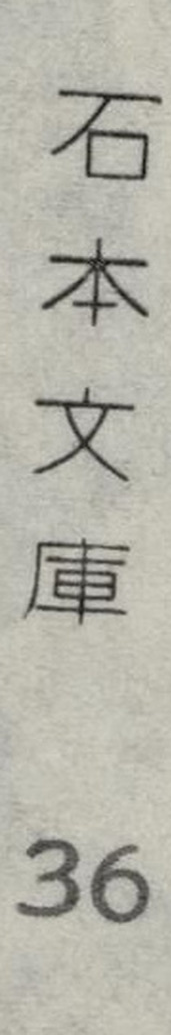石本文庫
